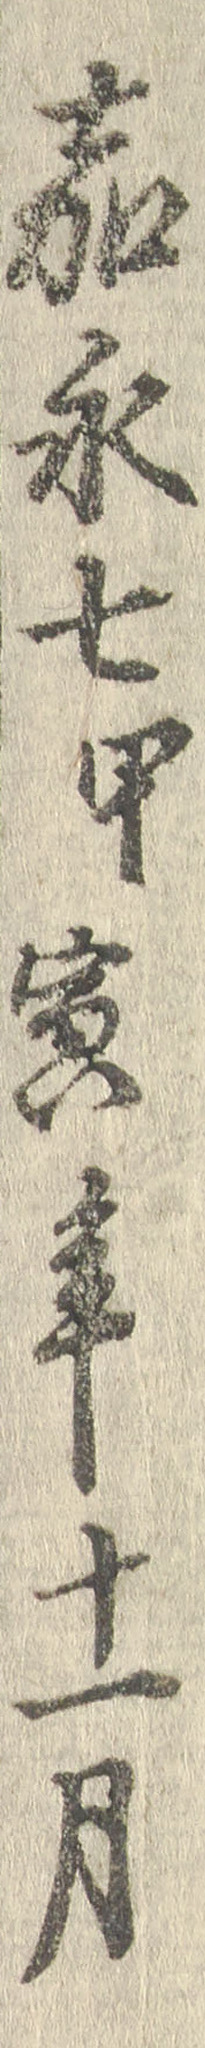嘉永七甲寅年十一月
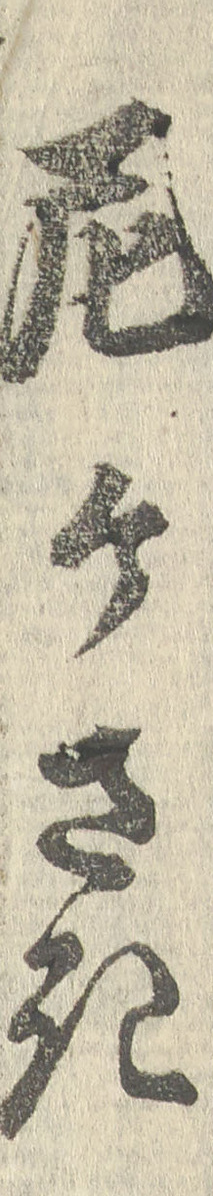尼ケさき
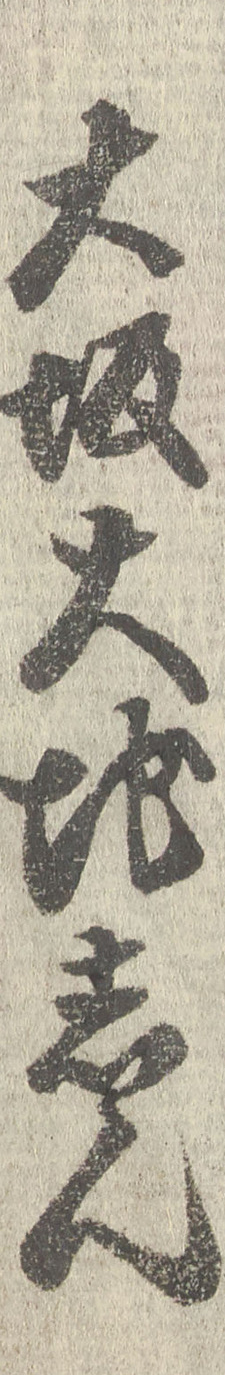大坂大地しん
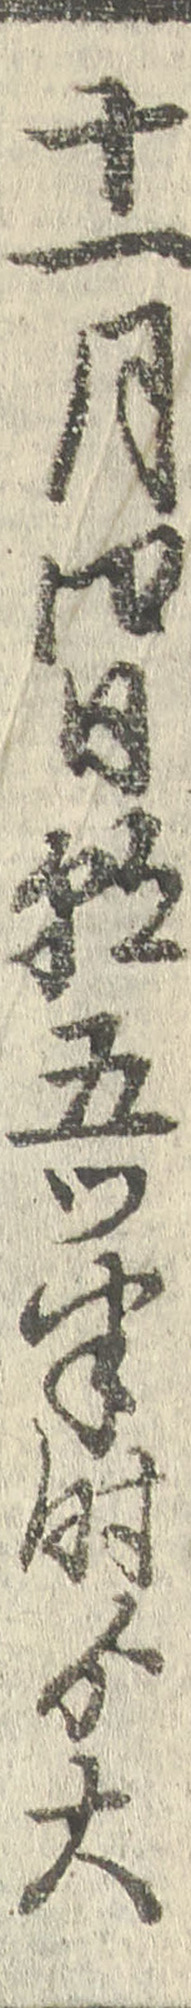十一月四日朝五ツ半時ゟ大
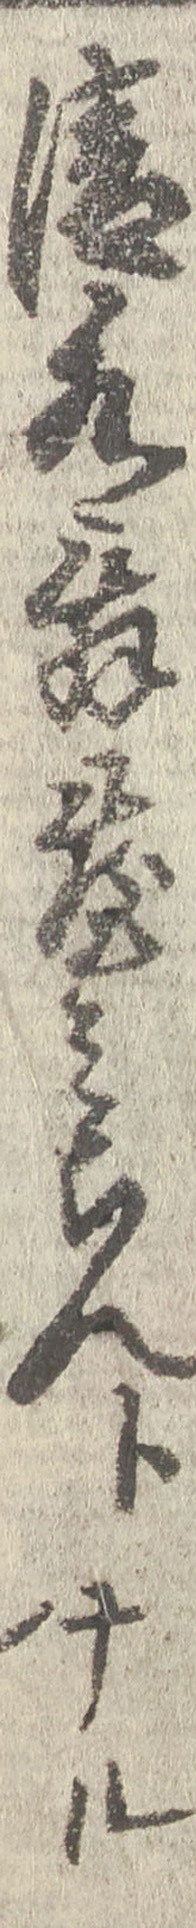清水舞台みちんとなる
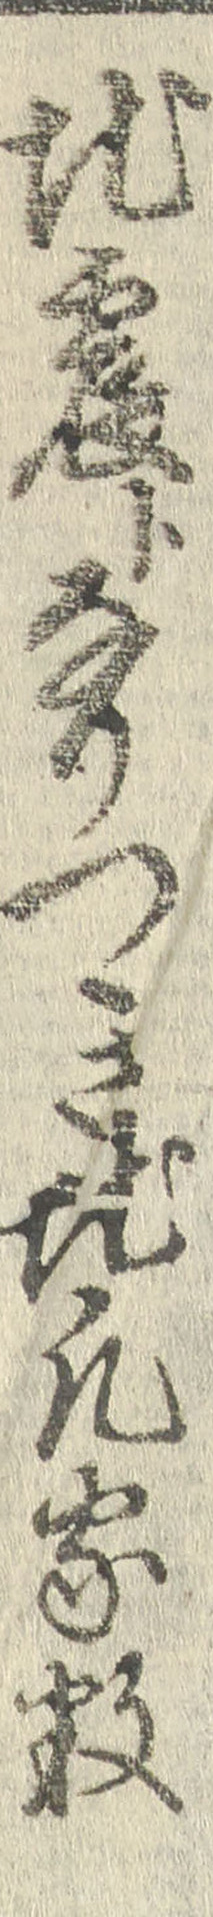地震となりつき地凡家数
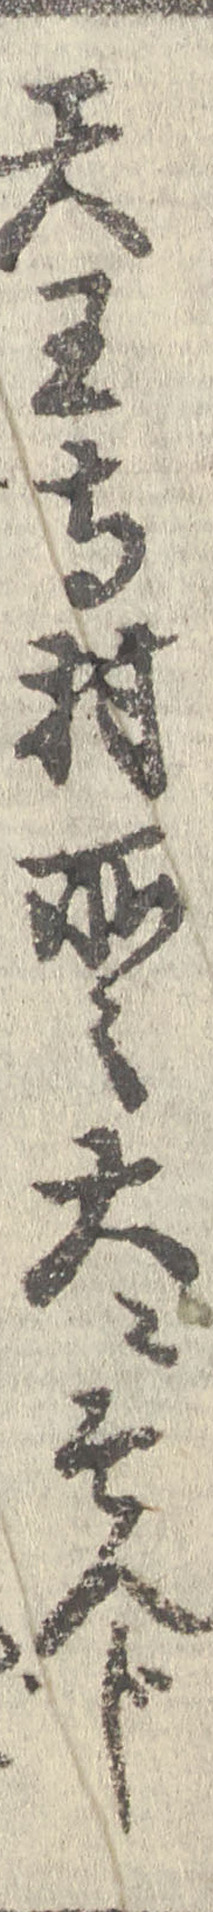天王寺村所々大にそんじ
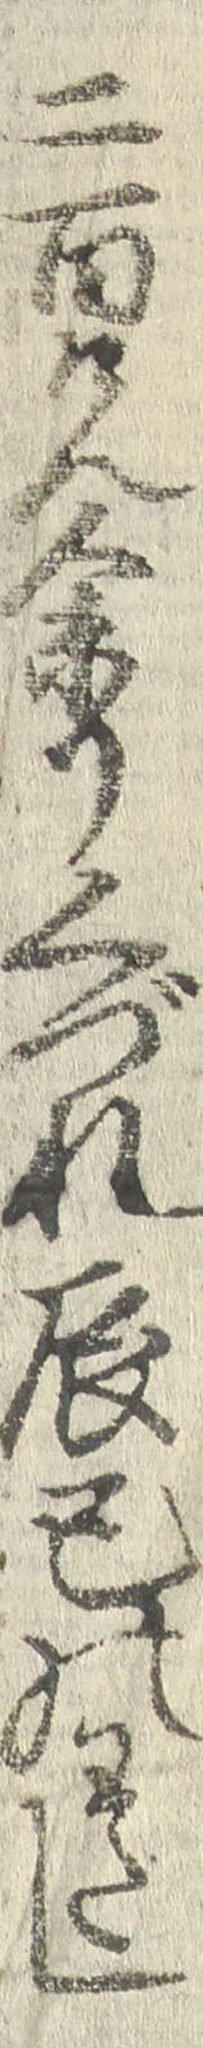二百けん余りくづれ辰巳のわたし
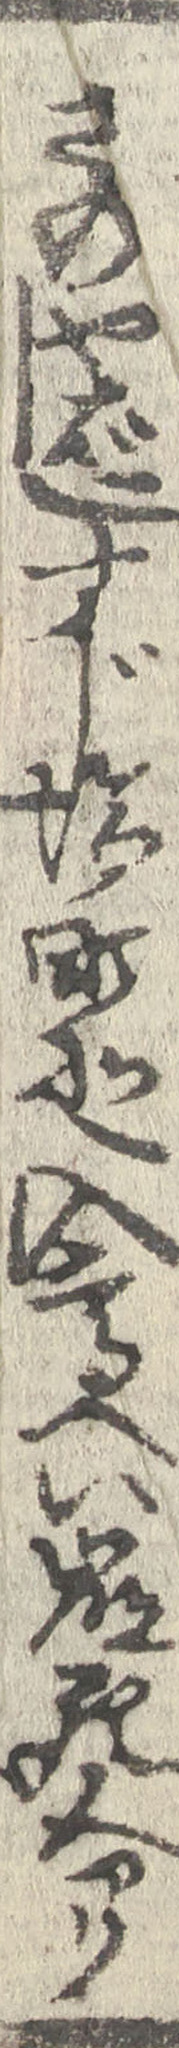さのやばしすじ塩町北へ入高へい崩死人あり
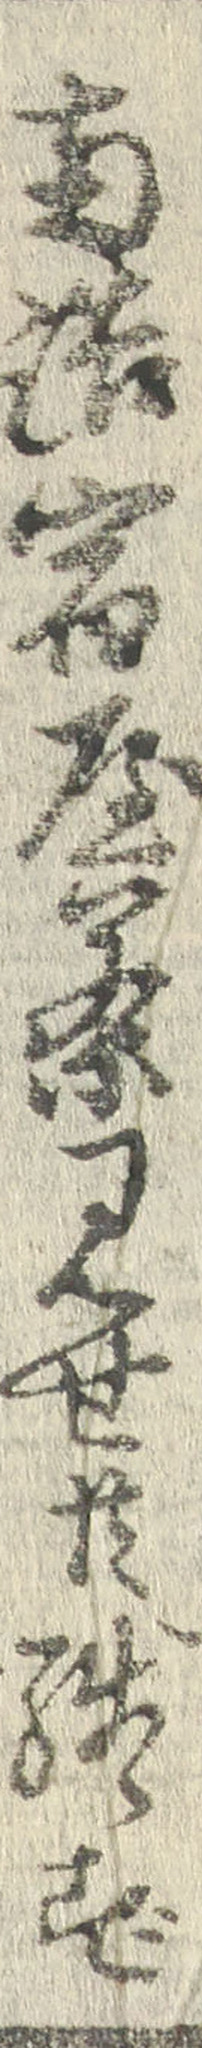南詰宿屋茶見世共残らず
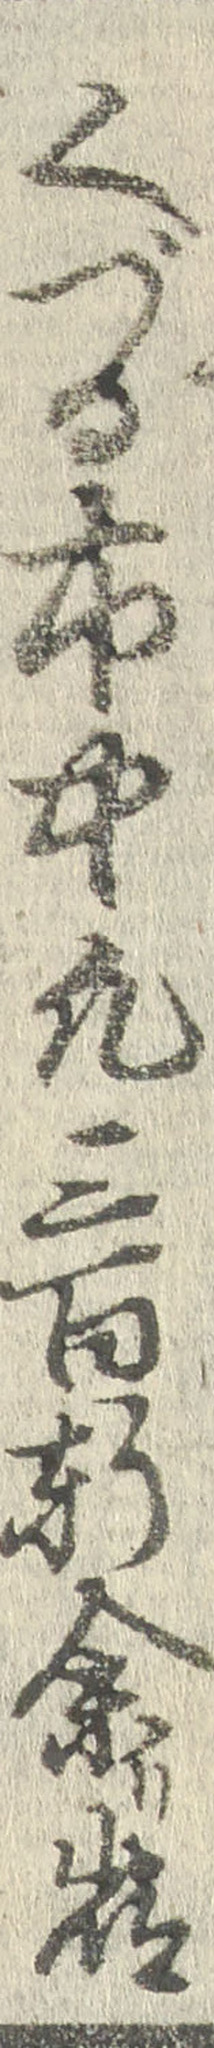くづる市中凡三百軒余り崩
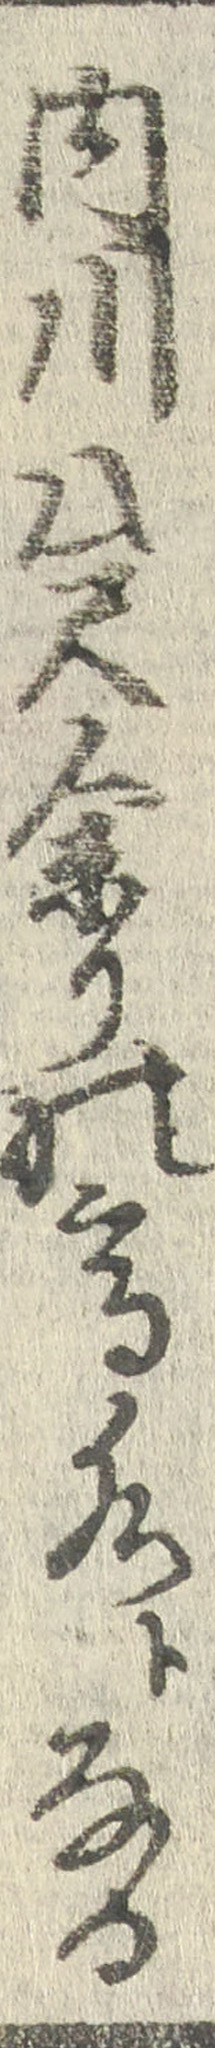内川八尺余の高水となる
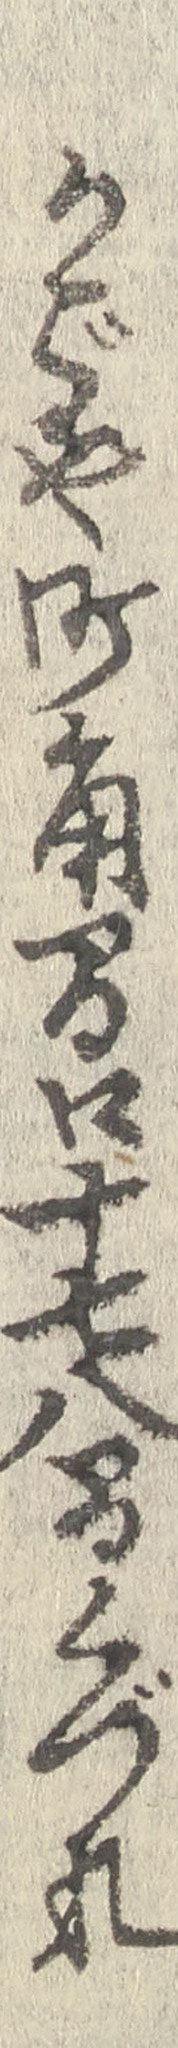かごや町角間口十七八間くづれ
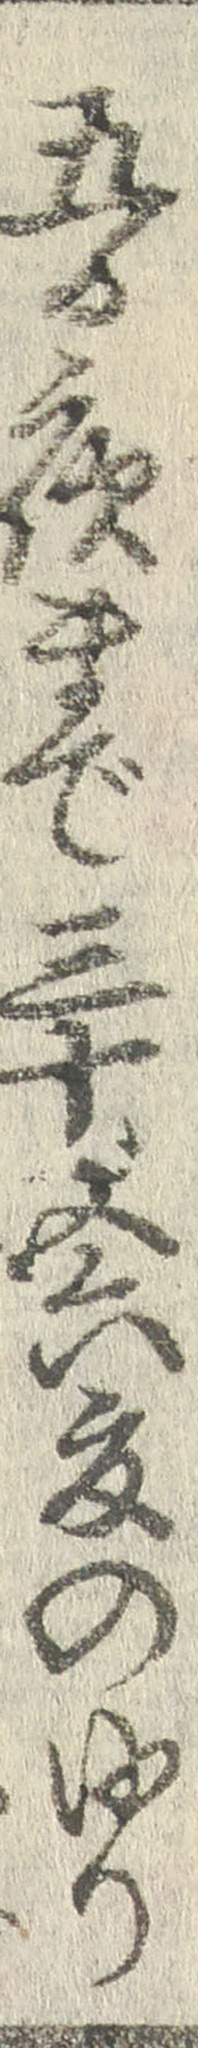五日夜まで三十五六度のゆり
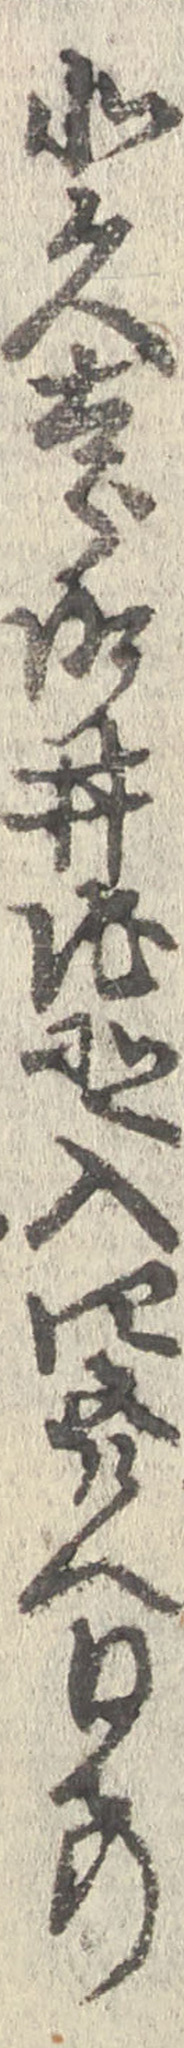北久太郎町丼池北へ入四五けん同断
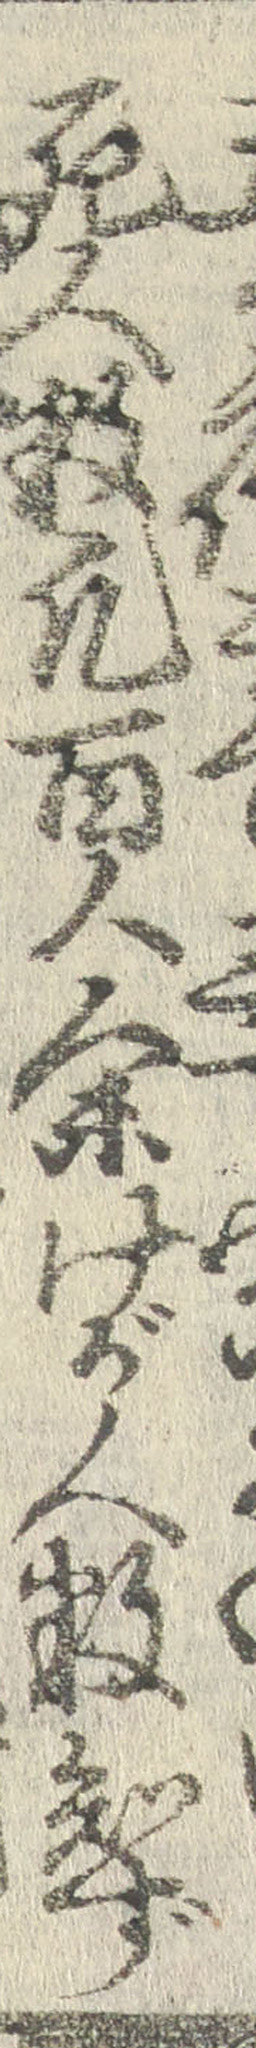死人数凡百人余けが人数知ず
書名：聞書諸国并大阪大地震つなみ
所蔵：東京大学総合図書館 General Library in the University of Tokyo, JAPAN
